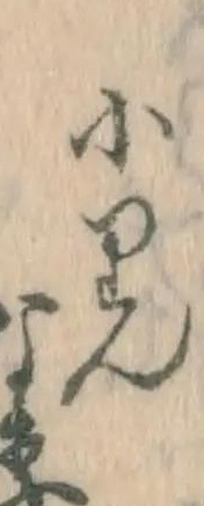小りん
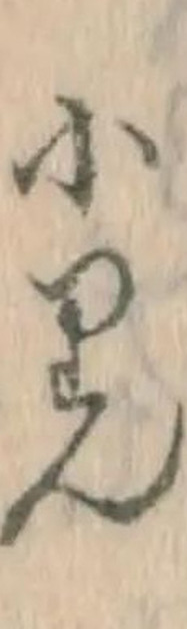小りん
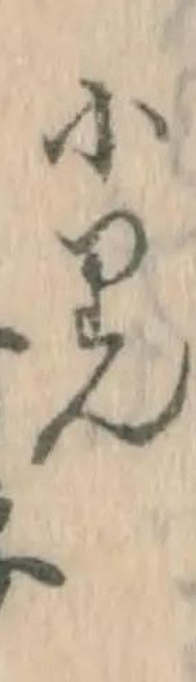小りん
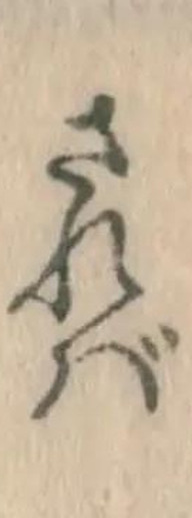されば
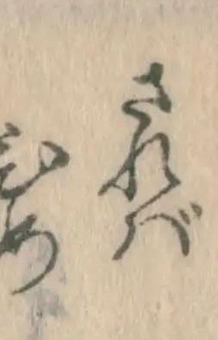されば
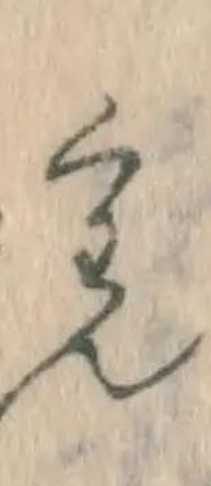くわん

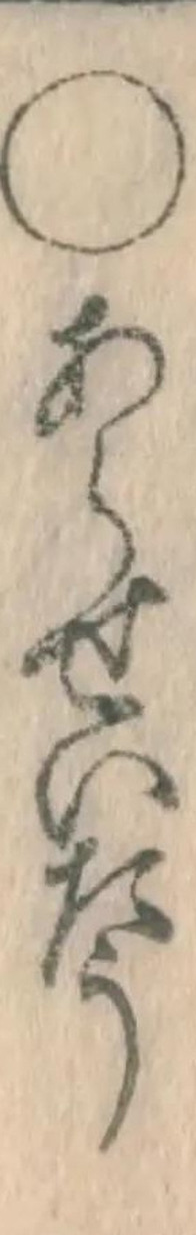〇あらせいたう
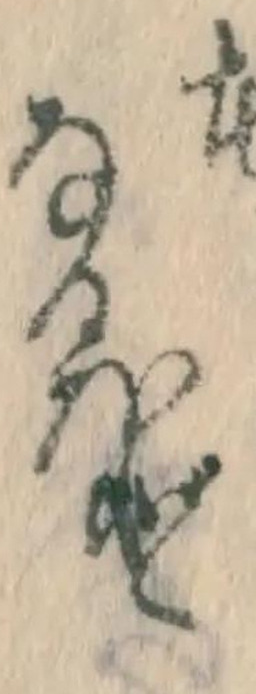なるほど
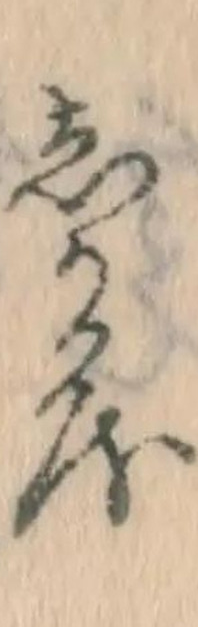しかも
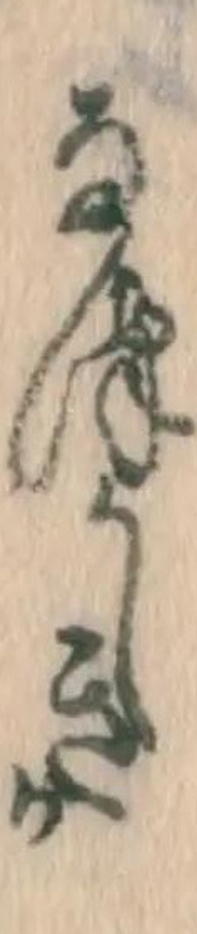なつかしき
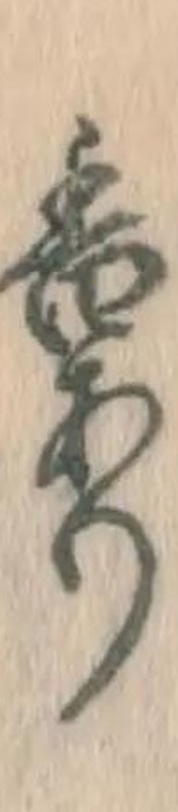香あり
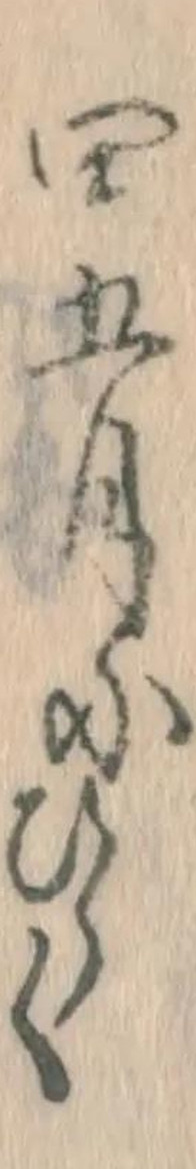四五月にひらく
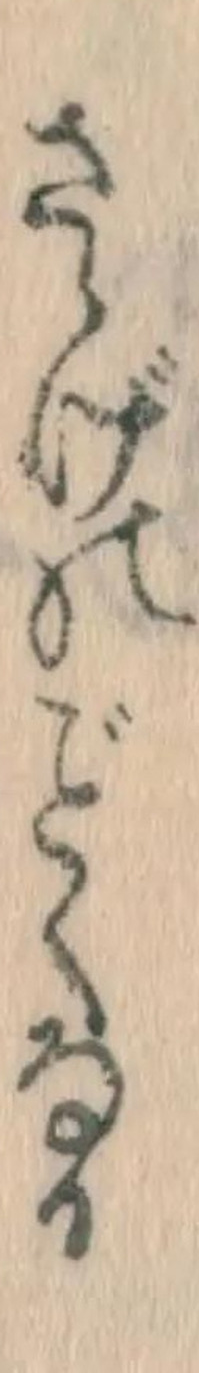さらげのごとくなる
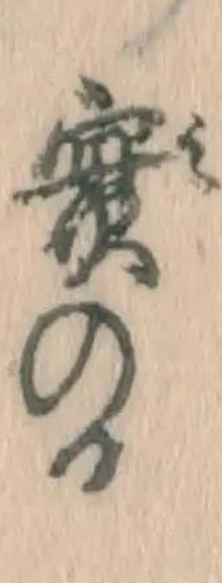実のる
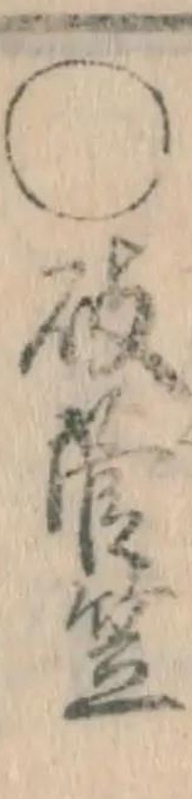〇破菅笠
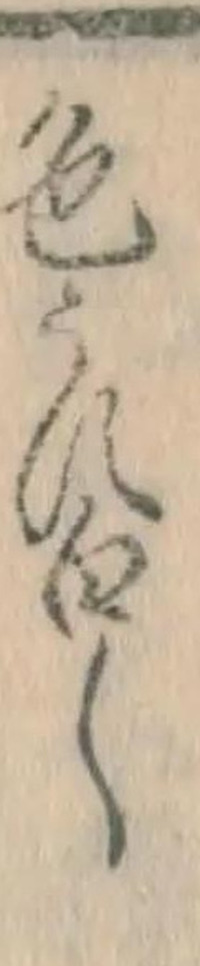色うす白く
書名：艸花繪前集. [2]
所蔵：国立国会図書館 National Diet Library, JAPAN
